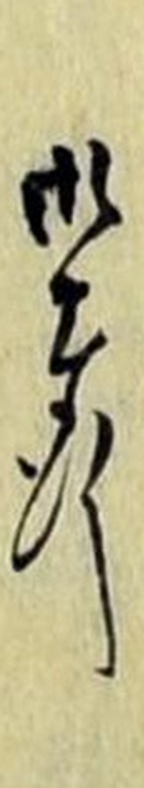御奉行
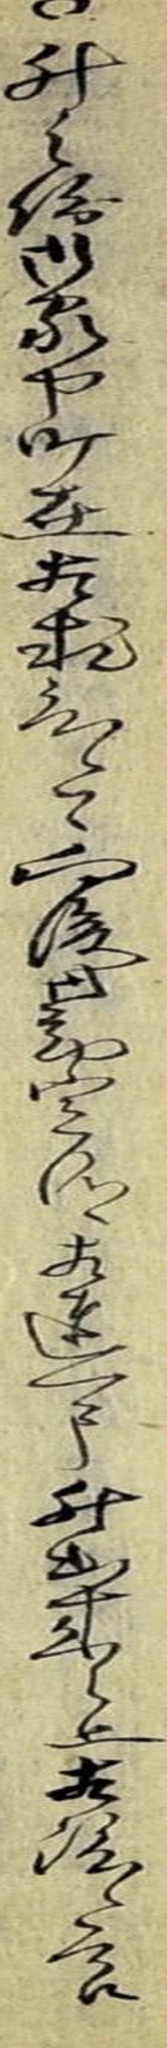〇升之儀御家中町在相求度候ハヽ向後御勘定所へ相達可申升出来候上相渡候節
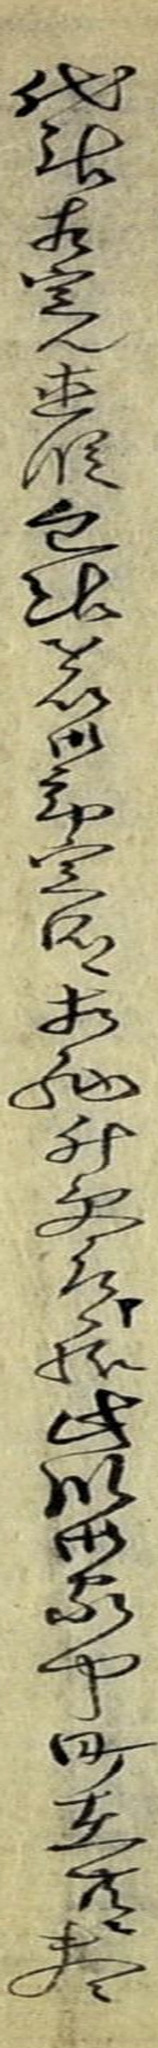代銀相定ル直段包銀を以御勘定所へ相納升受取申候様此段御家中町在共ニ夫々
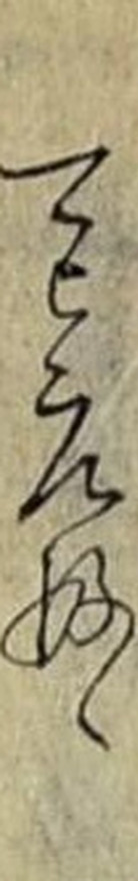可被取扱候
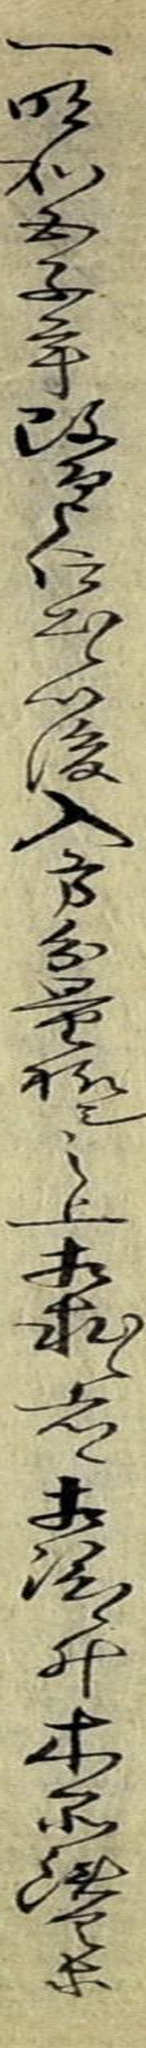一明和五子年改而被仰出候以後入方分量様シ之上相求候者へ相渡候升木品鉄具等
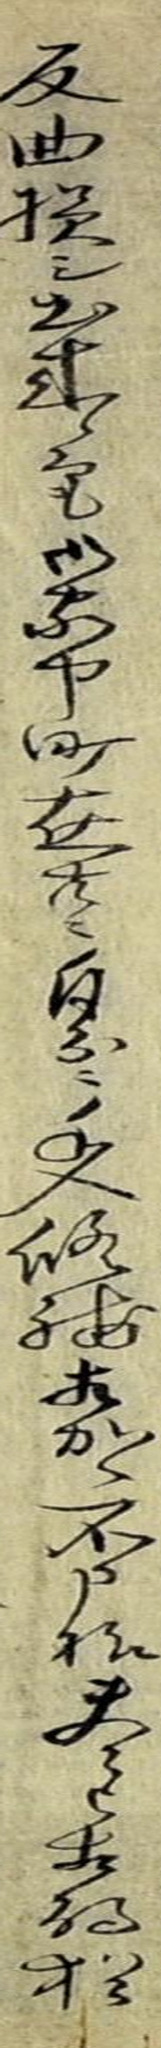反曲損シ出来候而も御家中町在共ニ自分ニ手入修補相加へ不申様夫々被相触猶
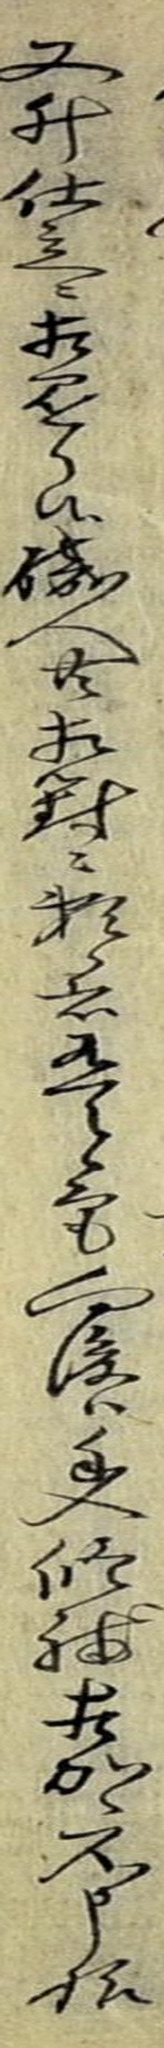又升仕立ニ相懸り候職人共相対ニ頼候者有之候而も向後ハ手入修補相加へ不申様
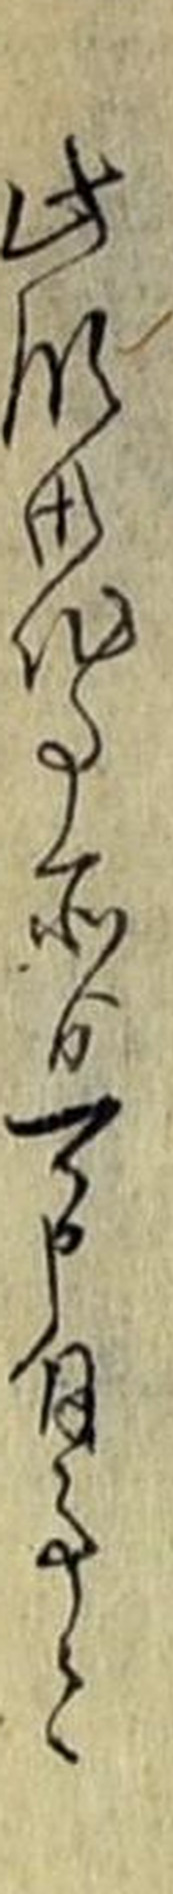此段御作事所ゟ可申付事ニ候
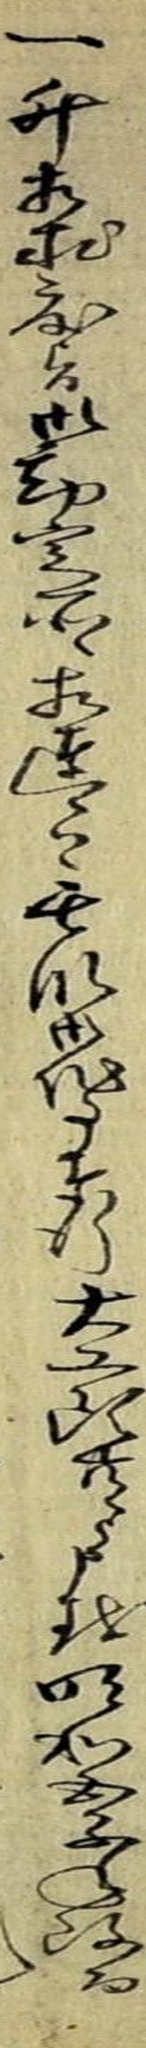一升相求度旨御勘定所へ相達候ハヽ其段御作事奉行大工頭共へ被申越明和五子年改而
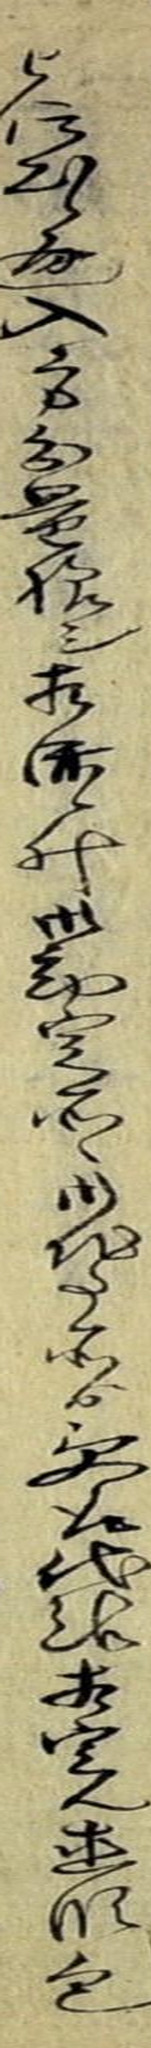被仰出候通入方分量様シ相済候升御勘定所へ御作事所ゟ受取代銀相定ル直段包
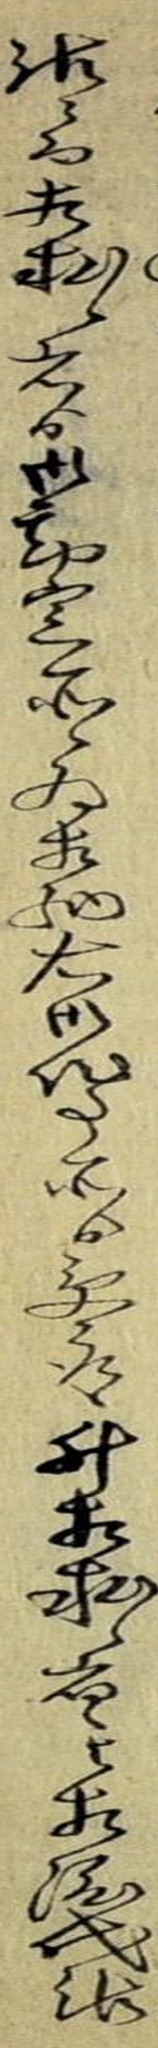銀ニ而相求候者ゟ御勘定所へ為相納右御作事所ゟ受取候升相求候者へ被相渡代銀
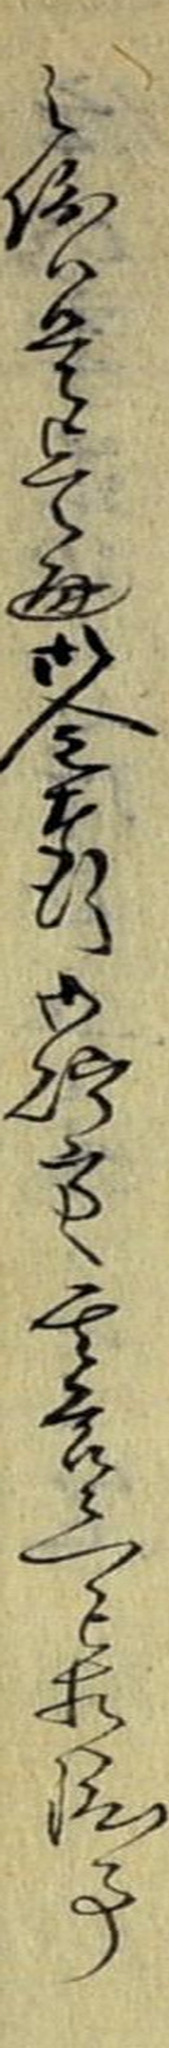之儀ハ是迄之通御金奉行御貯方へ其節ニ可被相渡事
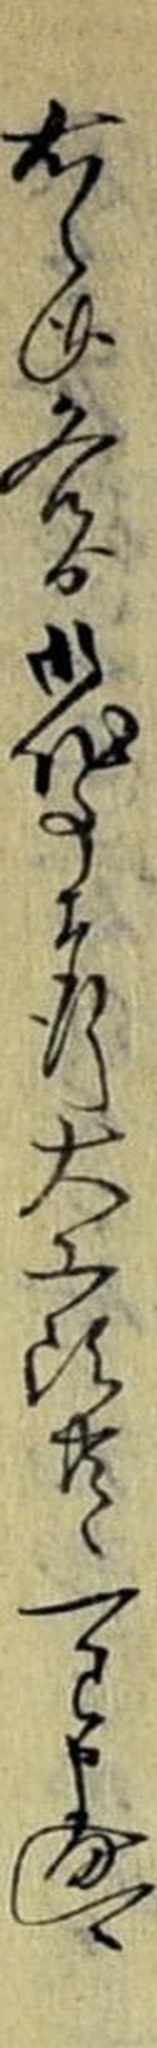右之趣各ゟ御作事奉行大工頭共へ可被申通候
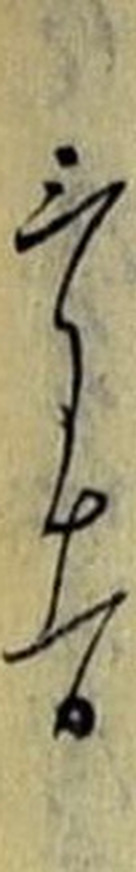三月十一日
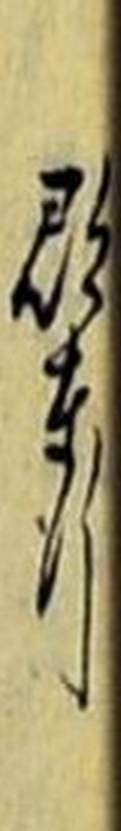郡奉行
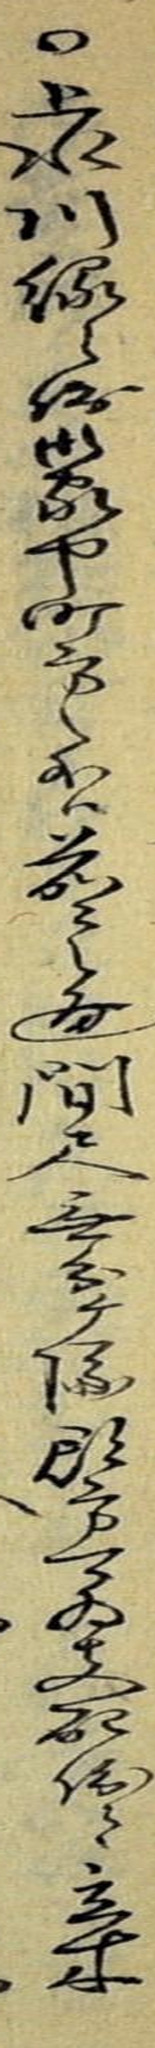〇上水川縁之儀御家中町方之外ハ前々之通間尺無分ケ隔郡方可為支配儀ニ候立木
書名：命令之部 三
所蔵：福井県文書館 Fukui Prefectural Archives
